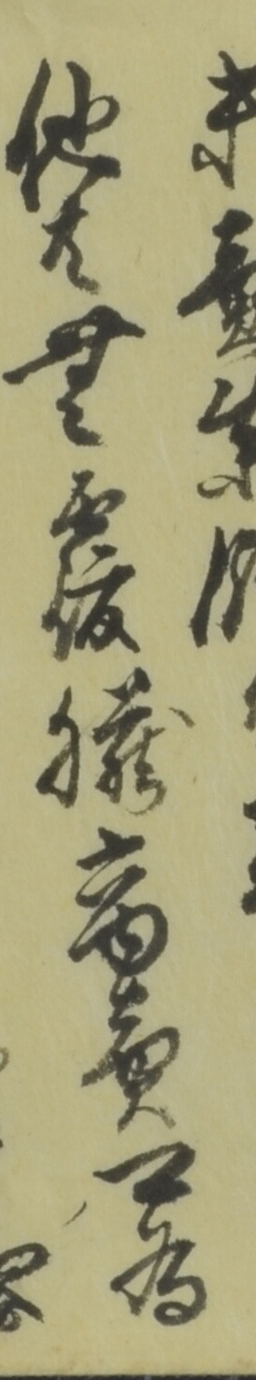他共無覆臓商売可為
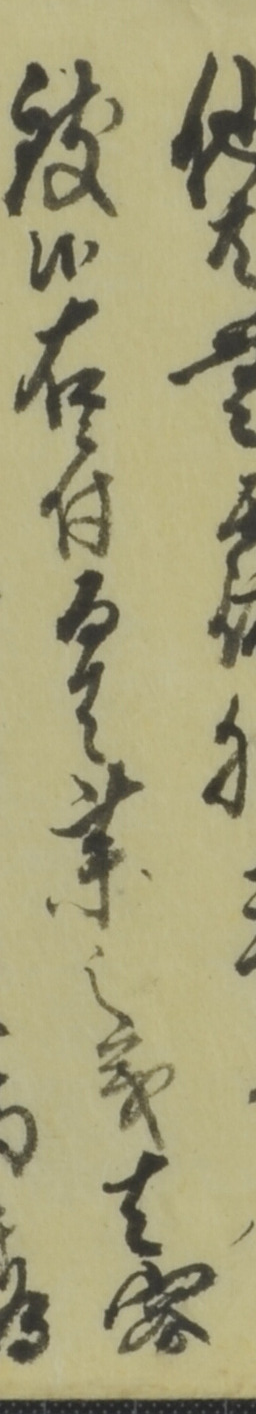致候右ニ付而は薬之義は容
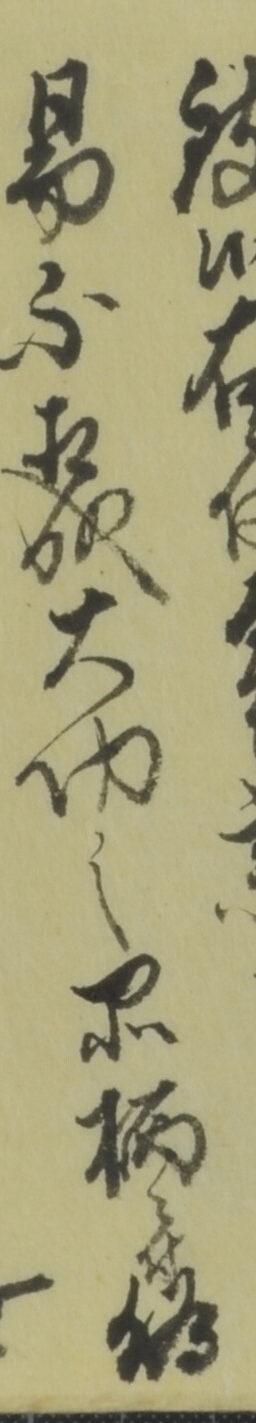易不相成大切之品柄ニ付偽
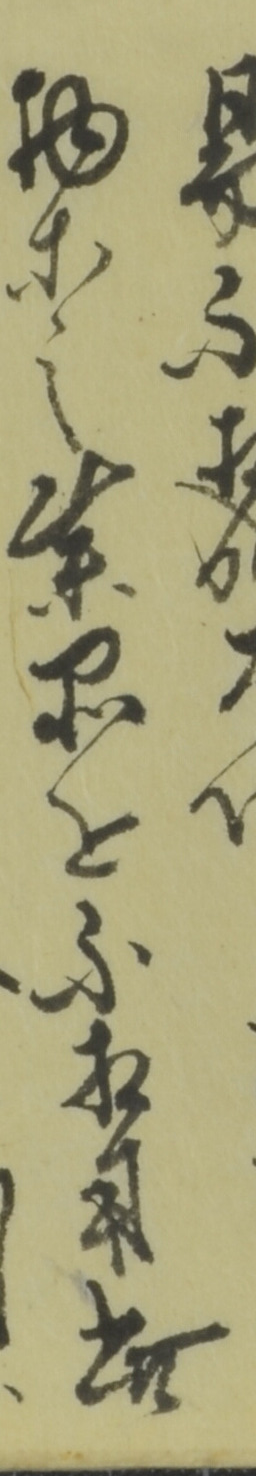物等之薬品を不相用此
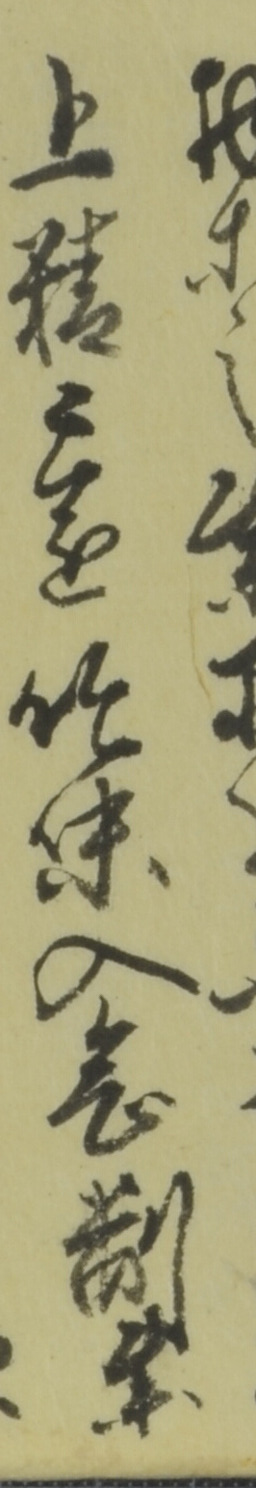上精々遂吟味入念制薬
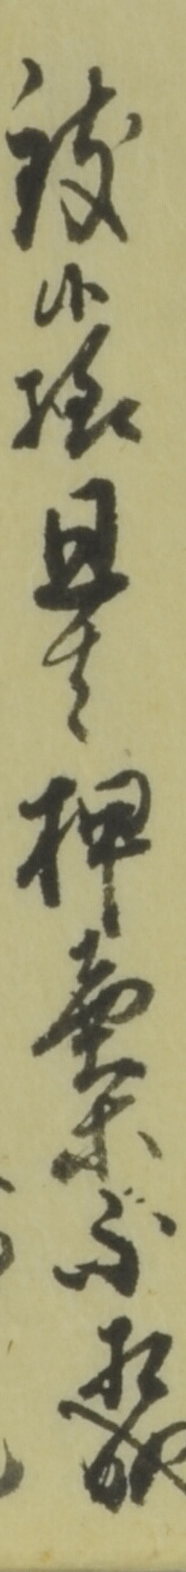致候様且は押売等不相成
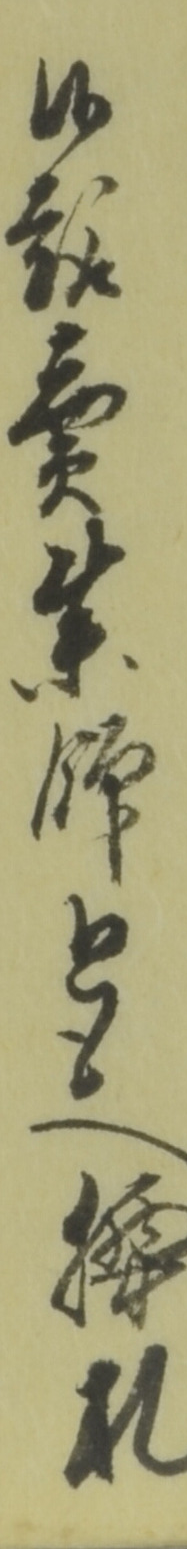候趣売薬師ともへ腰札
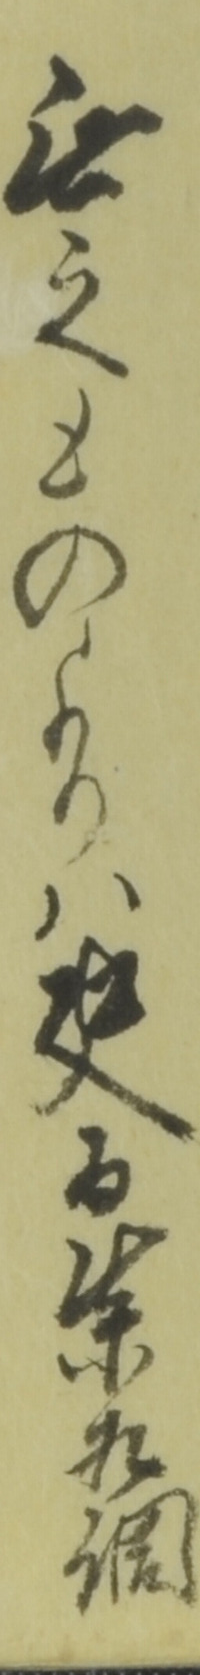無之ものよりハ決而薬相調

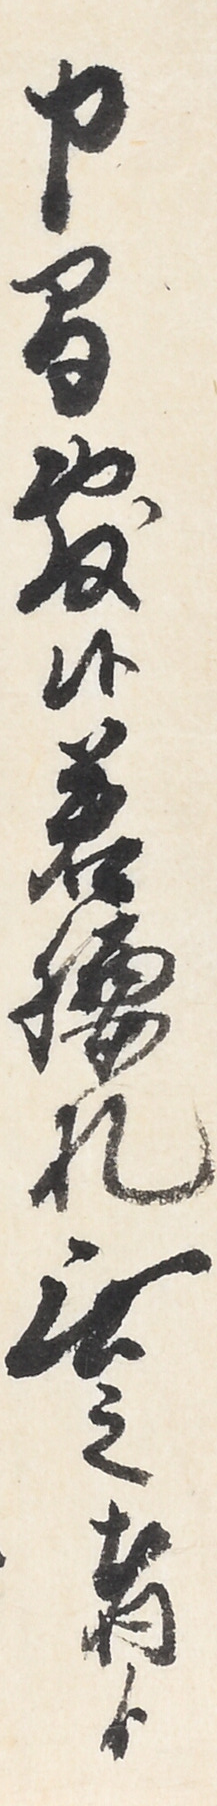申間敷候若腰札無之者ゟ
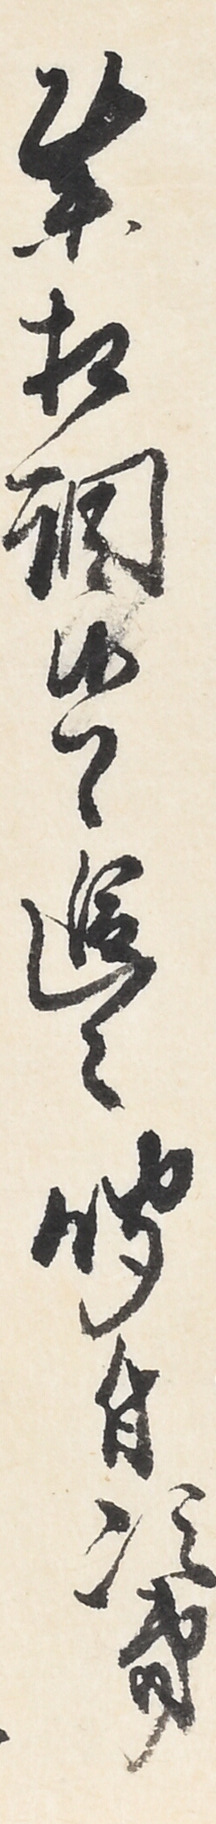薬相調候ハヽ追々聞付次第
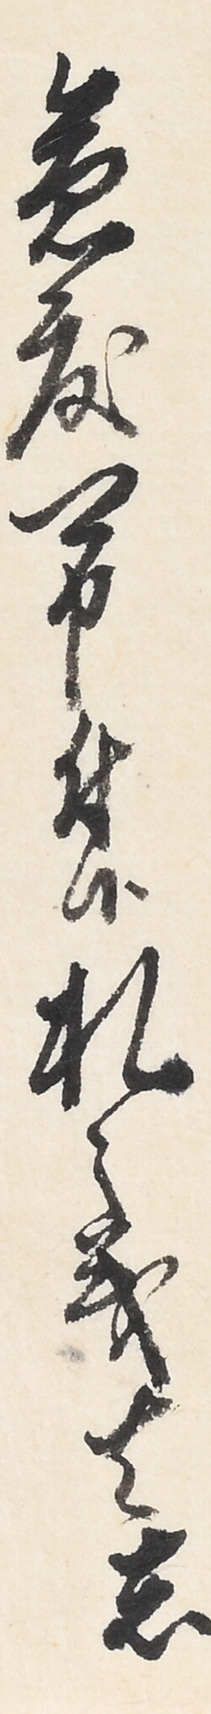急度可申付候札之義は志
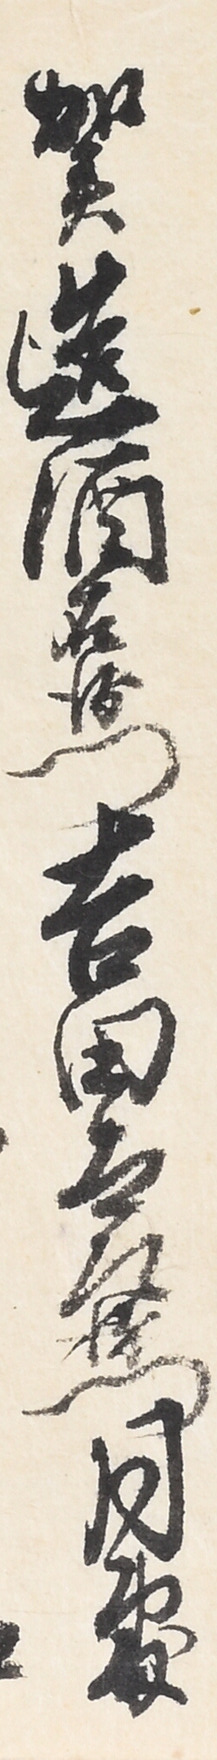賀造酒右衛門吉田太左衛門月番
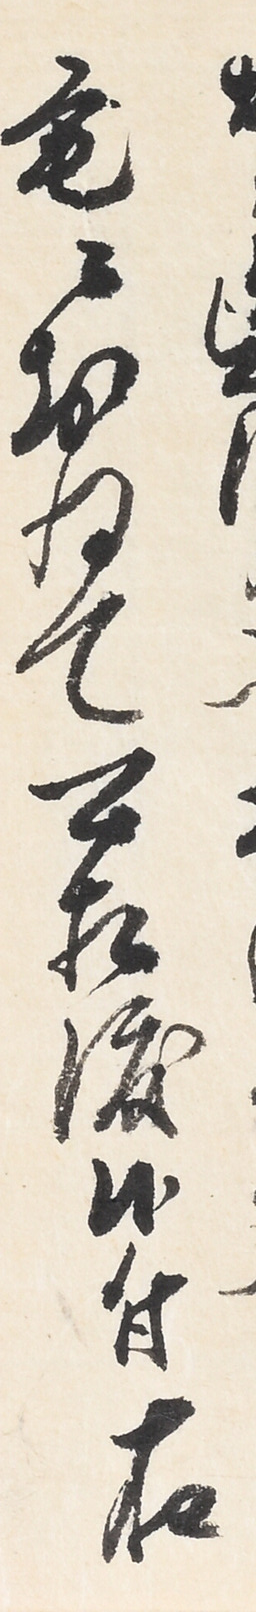毛ニおゐて可相渡候付右
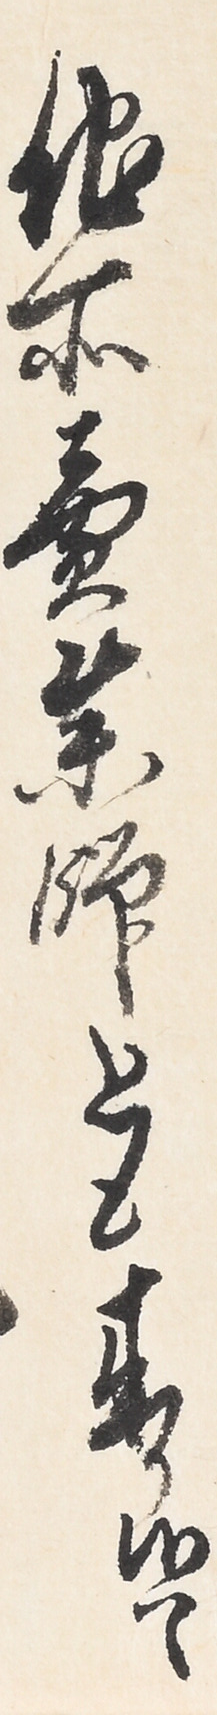他所売薬師とも来り候ハヽ
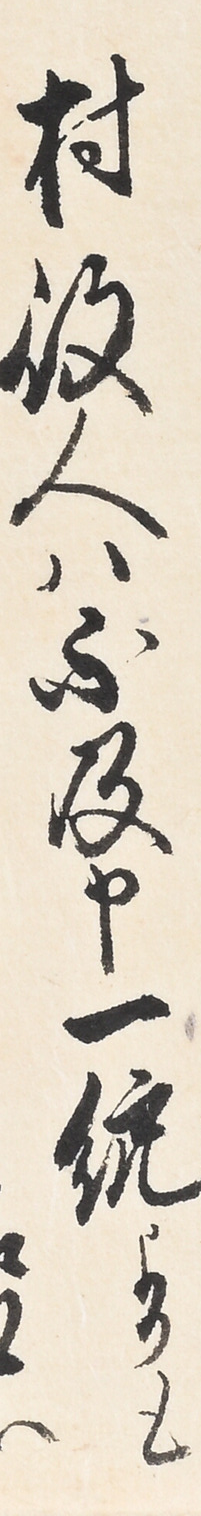村役人ハ不及申一統よりも
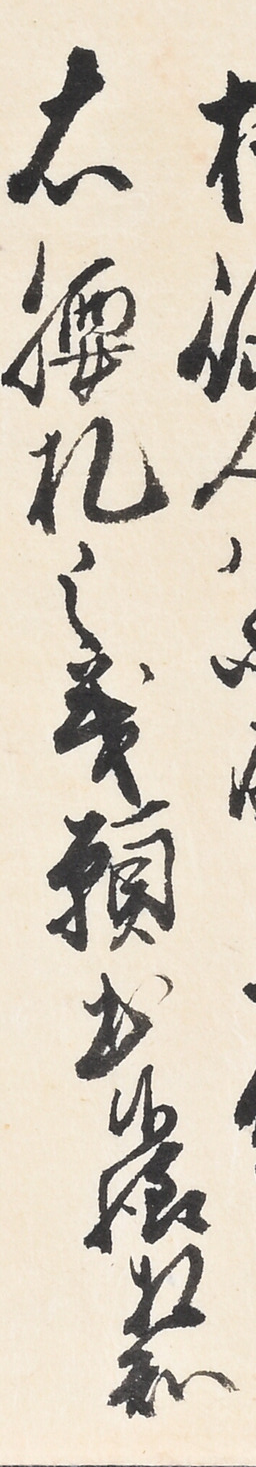右腰札之義願出候様相知
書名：御触書御書附控
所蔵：伊那市立高遠町図書館・合同会社AMANE
